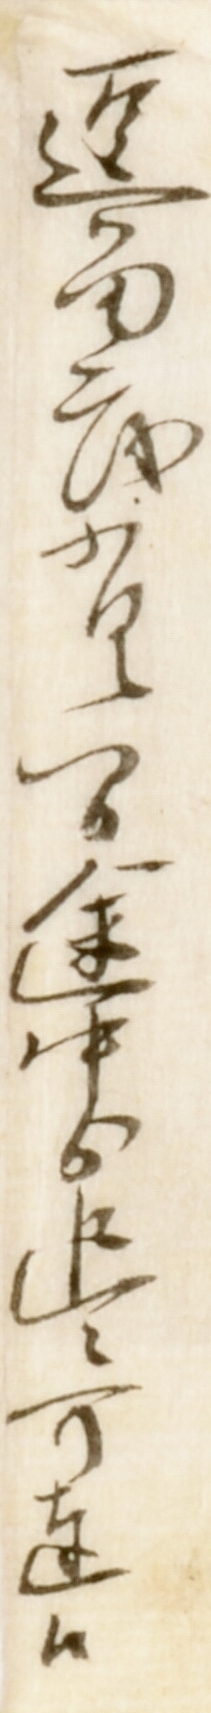逗留も有之間、途中ゟ追々可達候
